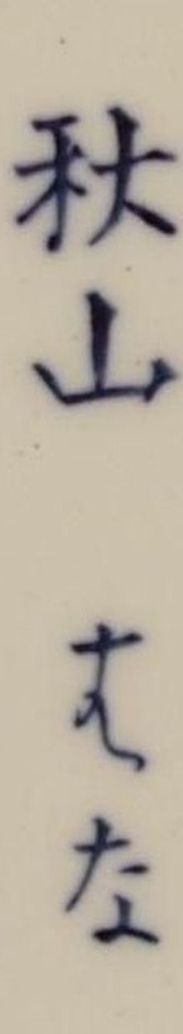秋山はな
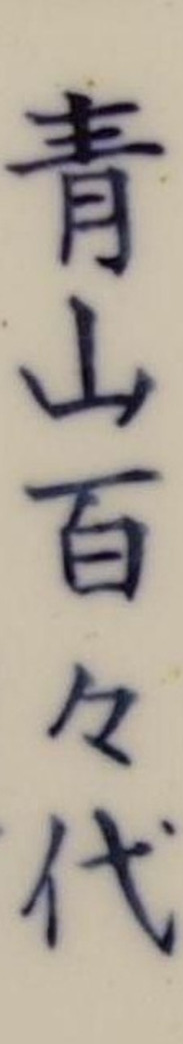青山百々代
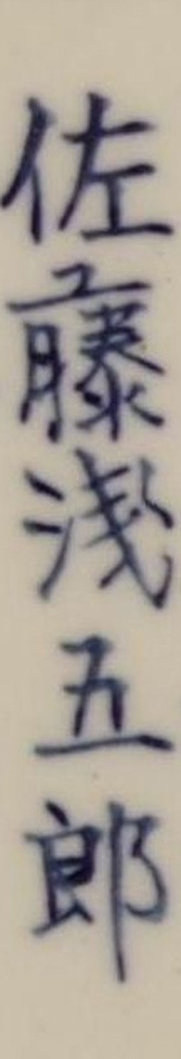佐藤浅五郎
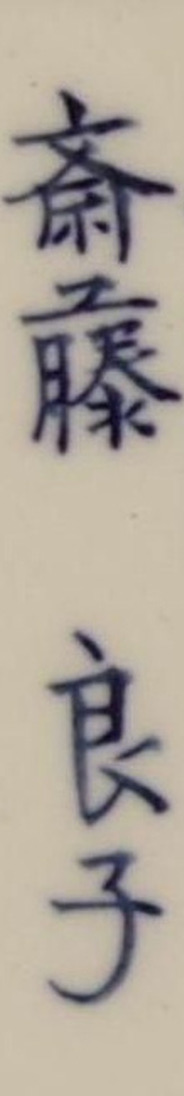斎藤良子

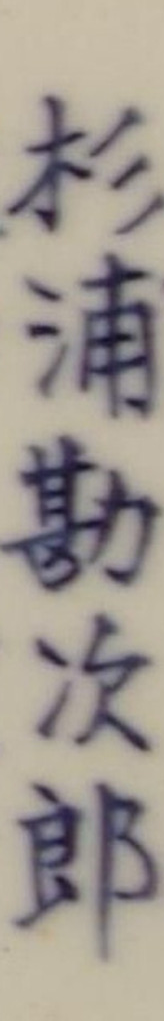杉浦勘次郎
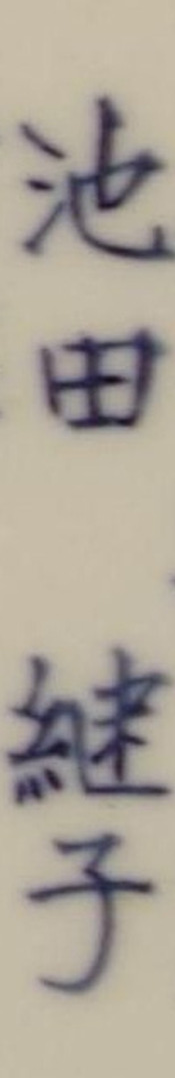池田継子
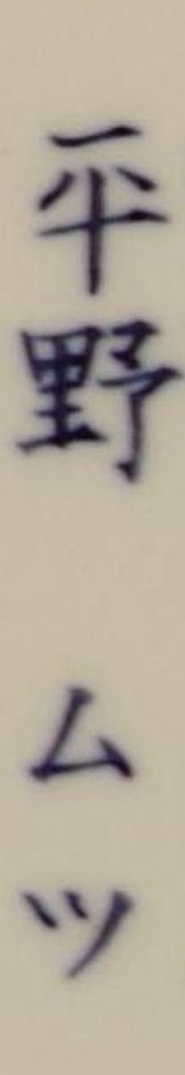平野ムツ
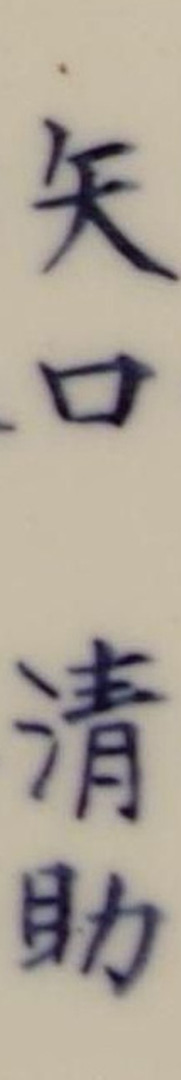矢口清助
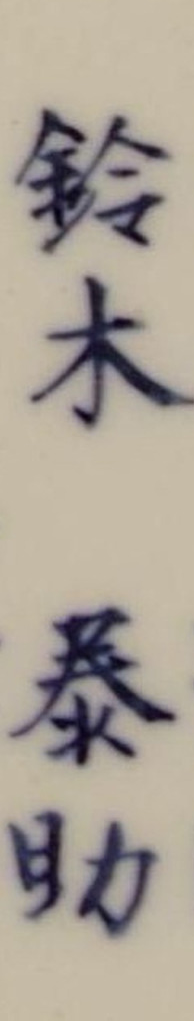鈴木泰助
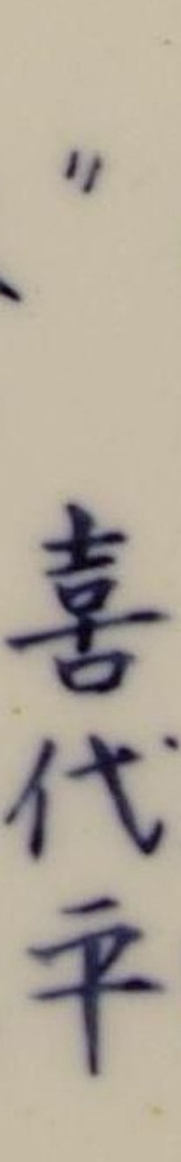喜代平
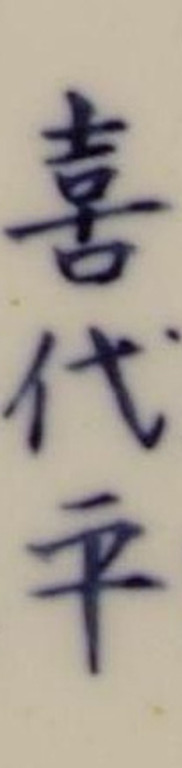喜代平
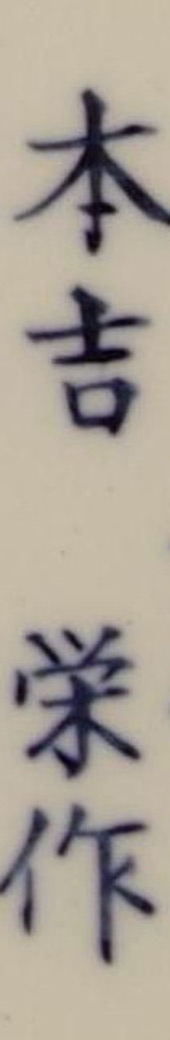本吉栄作
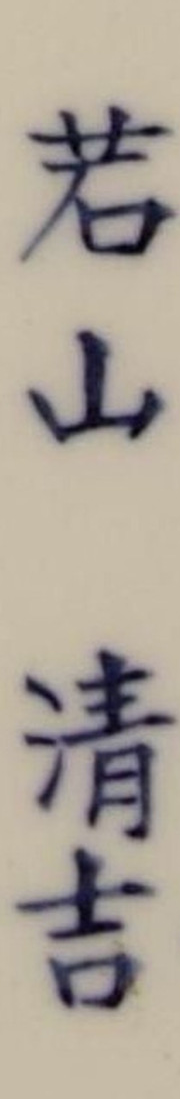若山清吉
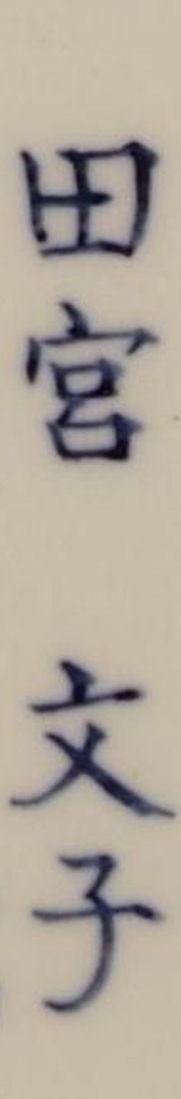田宮文子
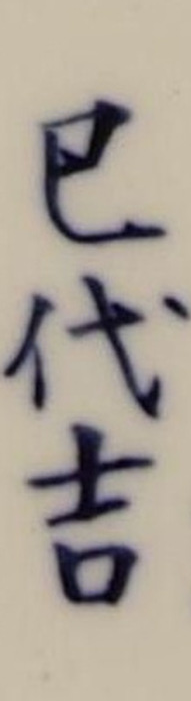巳代吉
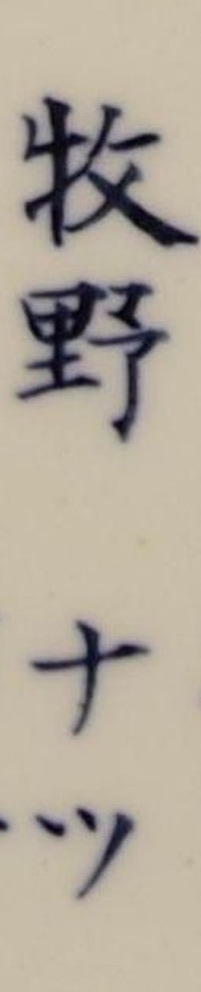牧野ナツ
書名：E~L
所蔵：高野山金剛峯寺
